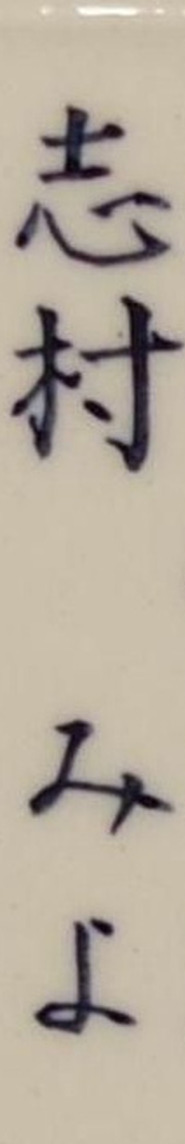志村みよ
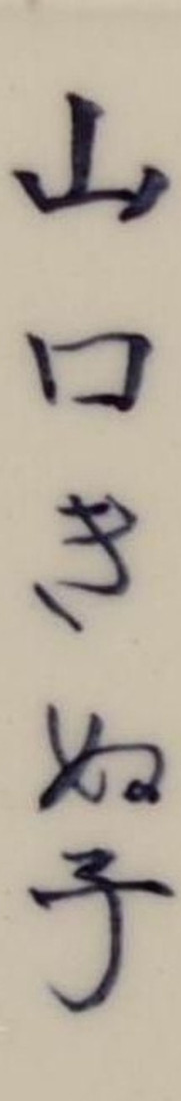山口きぬ子
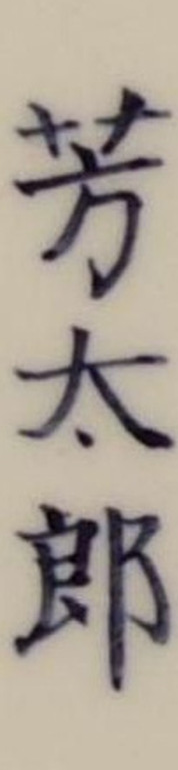芳太郎
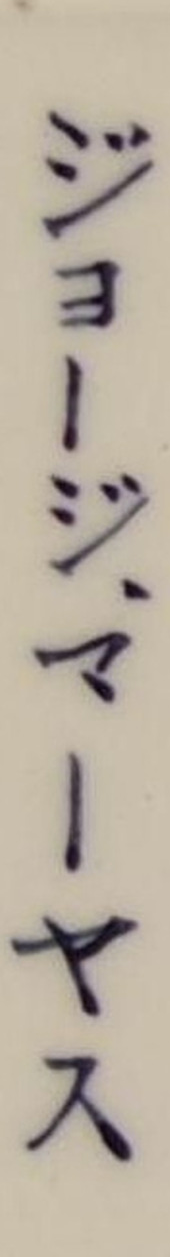ジョージマーヤス
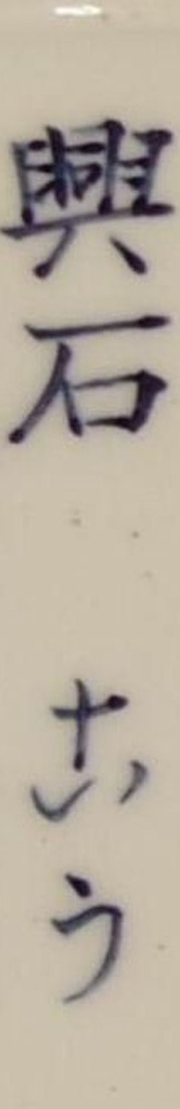興石こう
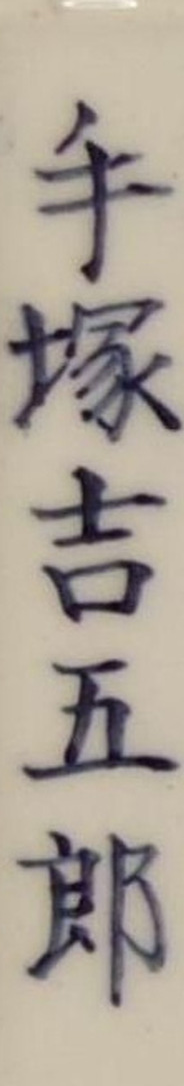手塚吉五郎

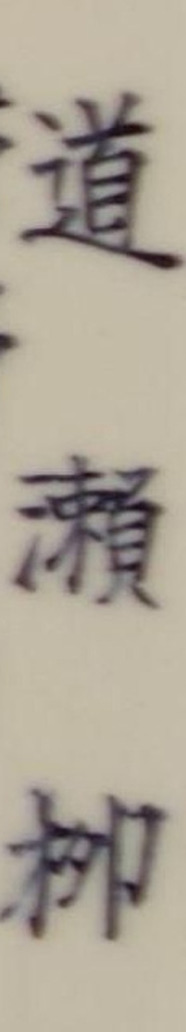道瀬柳
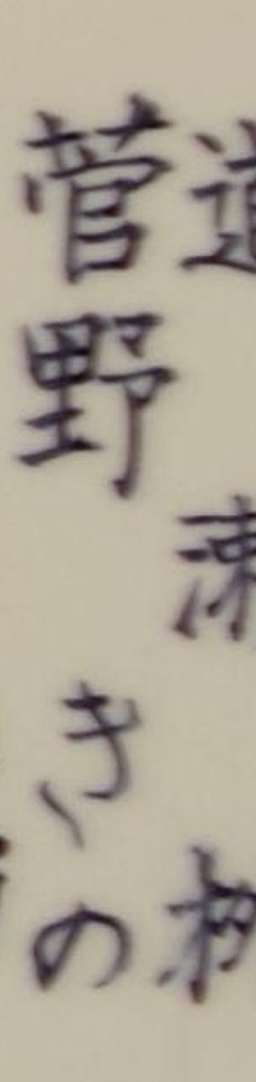菅野きの
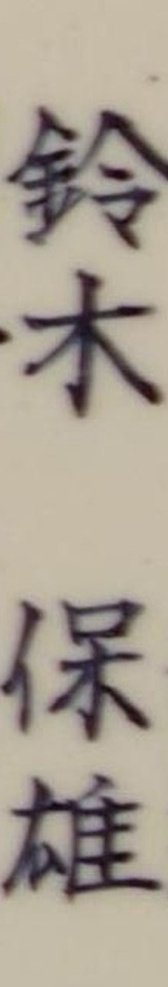鈴木保雄
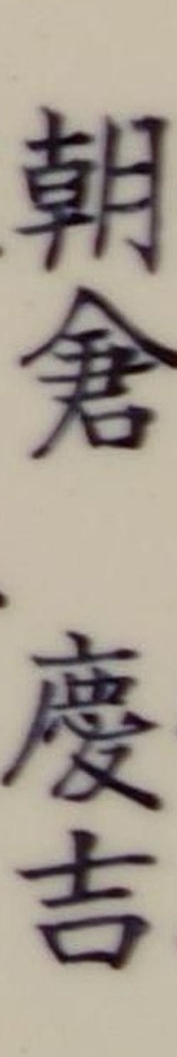朝倉慶吉
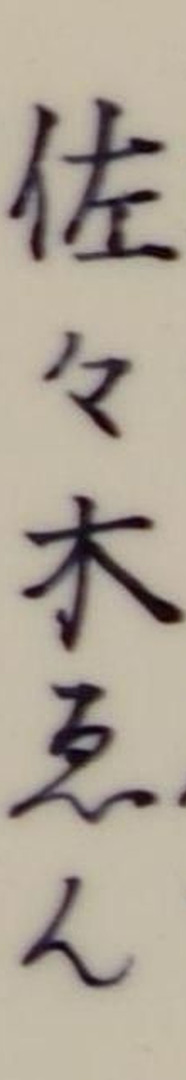佐々木ゑん
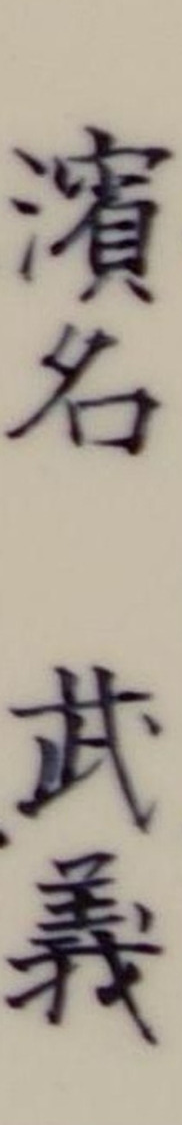濱名武義
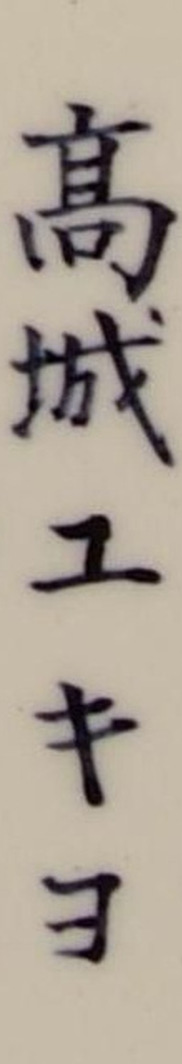高城ユキヨ
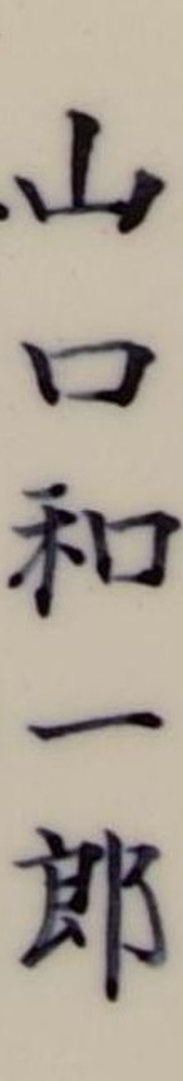山口和一郎
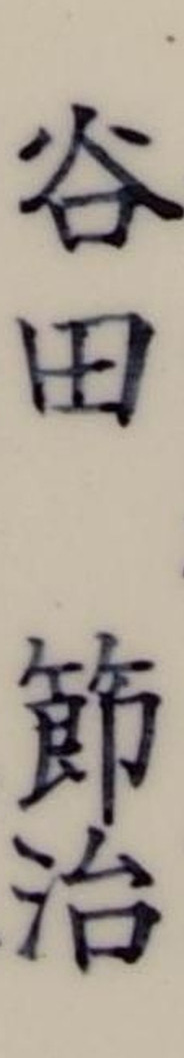谷田節治
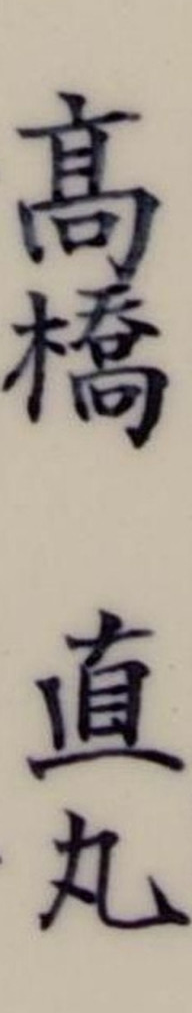高橋直丸
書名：M~S
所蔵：高野山金剛峯寺
